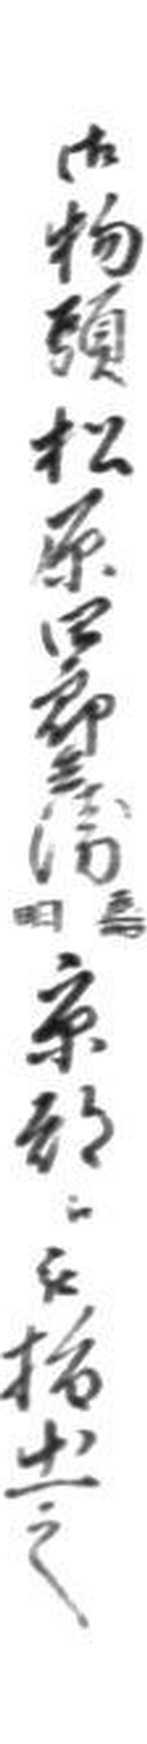御物頭松原四郎兵衛嘉明京都江指出之
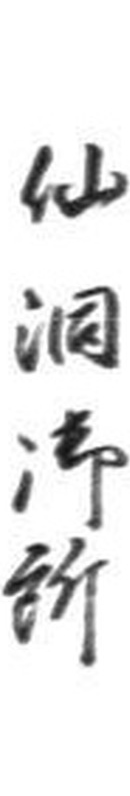仙洞御所
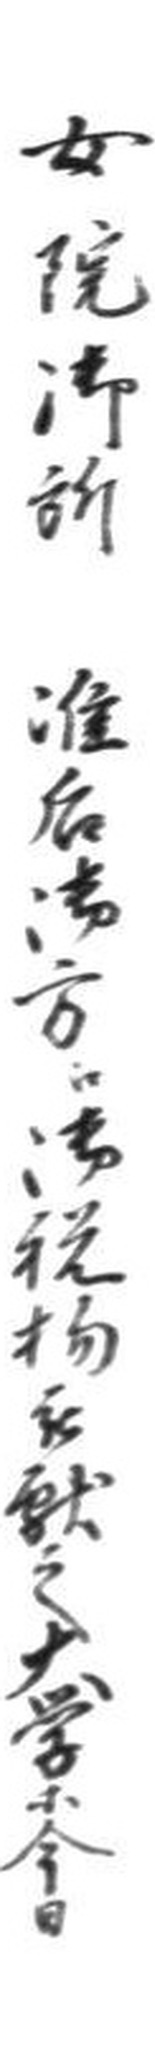女院御所准后御方江御祝物被献之大学等今日

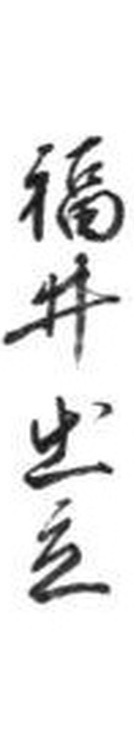福井出立
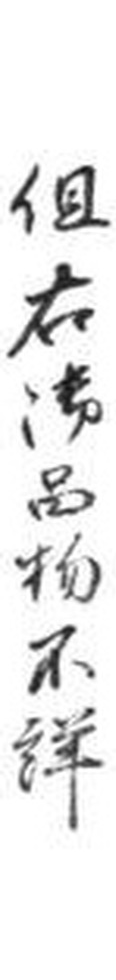但右御品物不詳
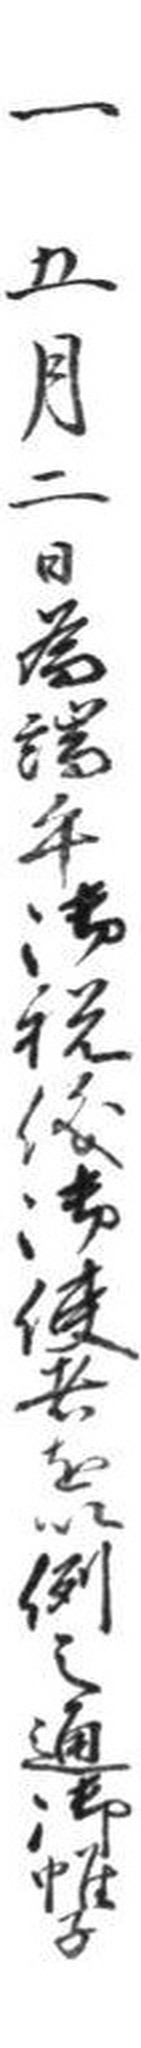一五月二日為端午御祝儀御使者を以例之通御帷子
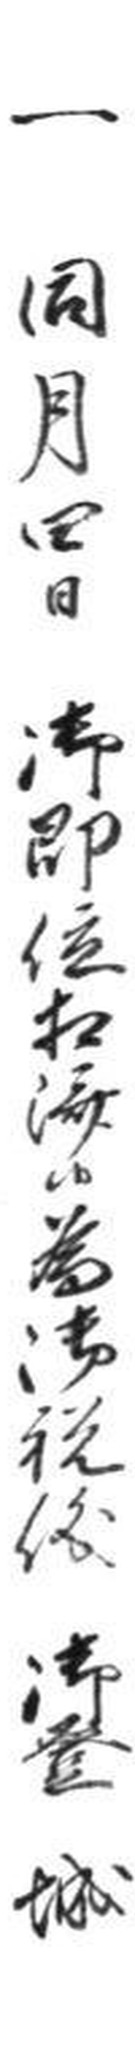一同月四日御即位相済候為御祝儀御登城
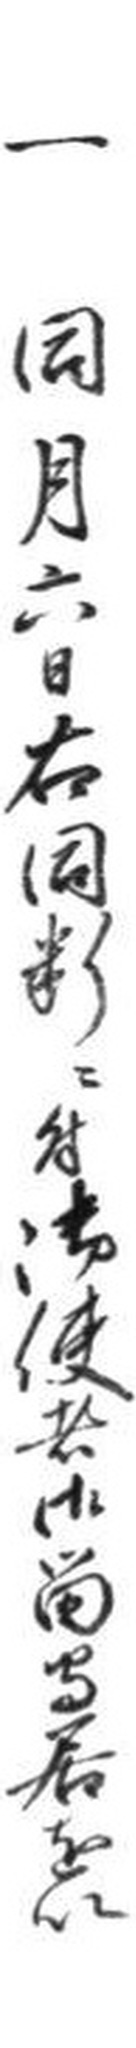一同月六日右同断ニ付御使者御留守居を以
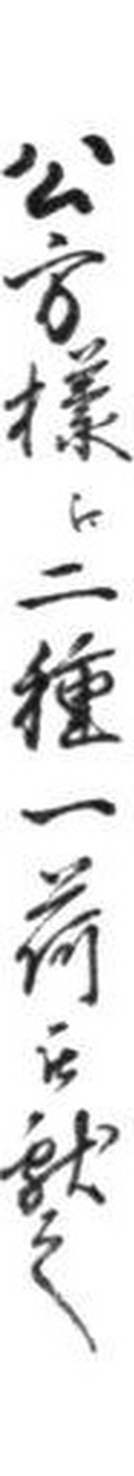公方様江二種一荷被献之
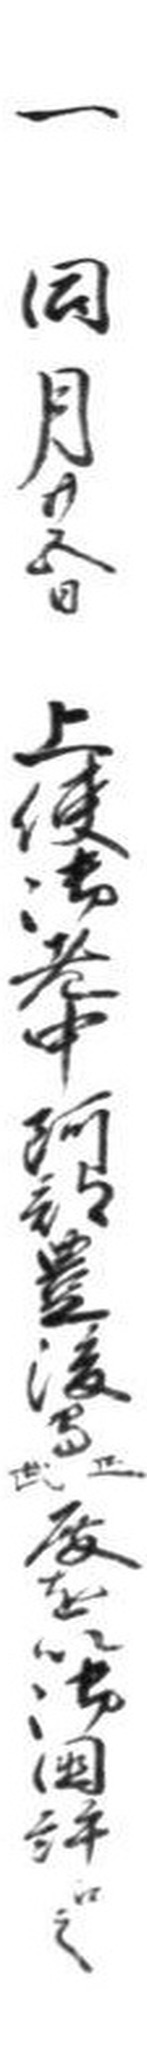一同月廿五日上使御老中阿部豊後守正武殿を以御国許江之
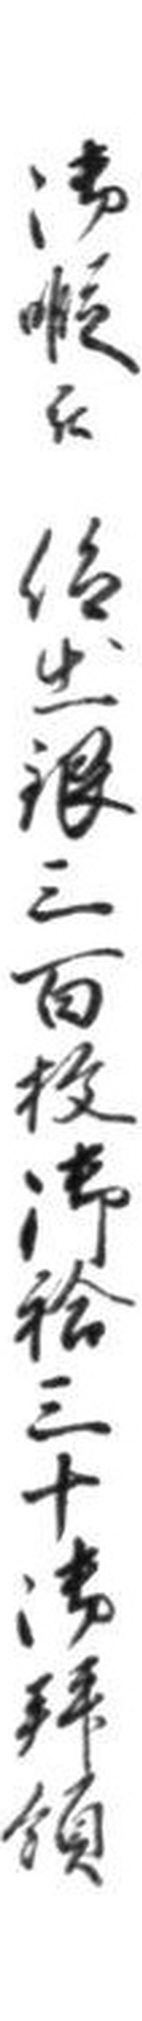御暇被仰出銀三百枚御袷御三十御拝領
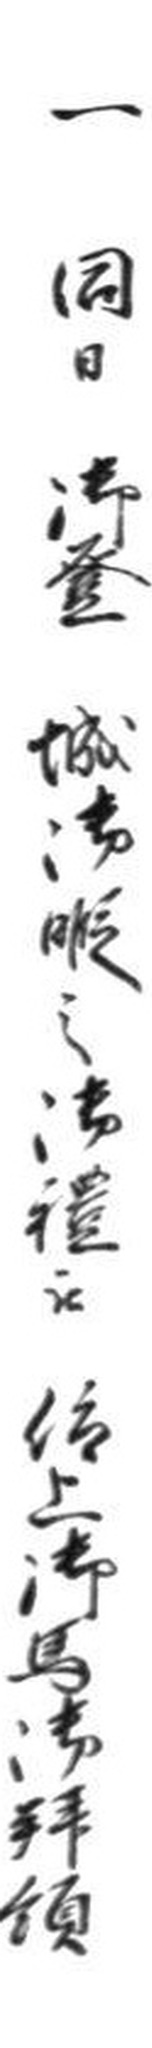一同日御登城御暇之御礼被仰上御馬御拝領
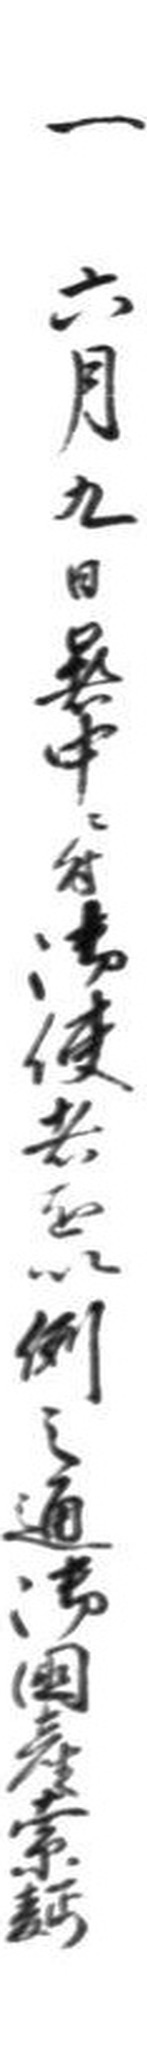一六月九日暑中ニ付御使者を以例之通御国産素麵
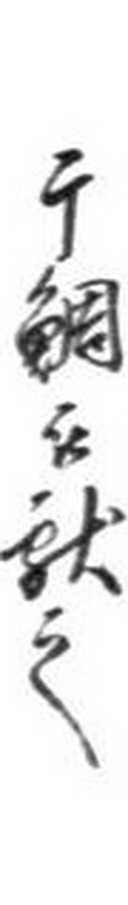干鯛被献之
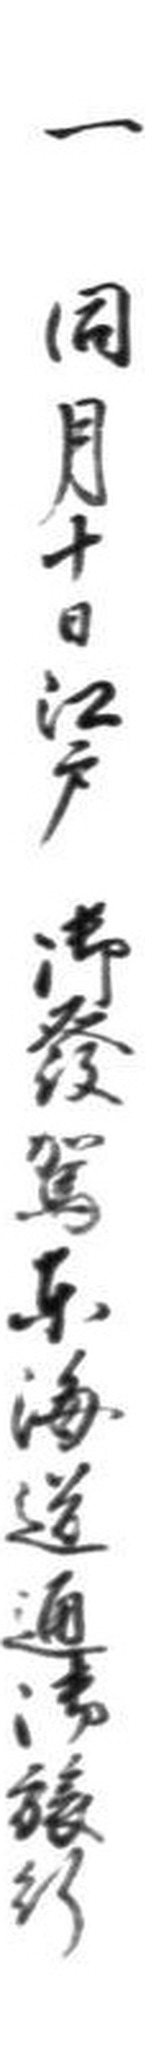一同月十日江戸御発駕東海道通御旅行
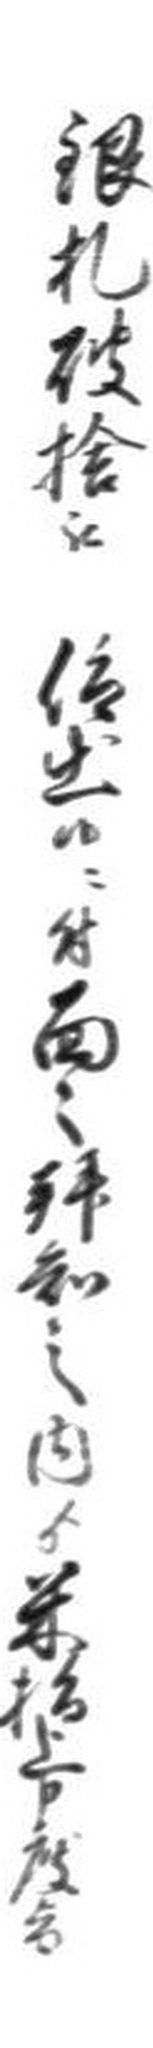銀札破捨被仰出候ニ付面々拝知之内ゟ米指上申度旨
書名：家譜 十六 吉品公 従貞享三年閏三月到同四年
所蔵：福井県文書館 Fukui Prefectural Archives
